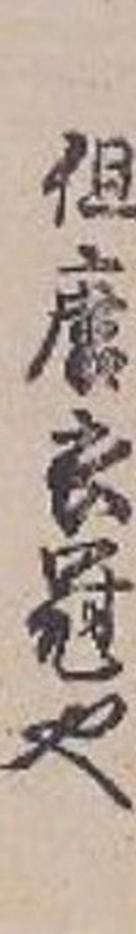但唐衣冠也
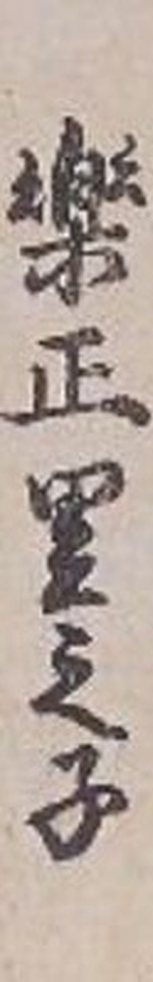楽正里之子
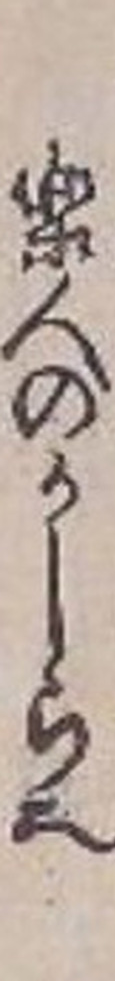楽人のかしら也
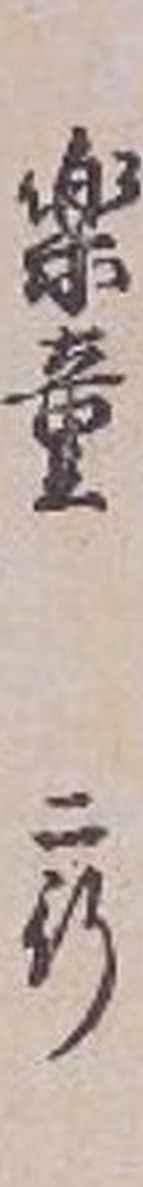楽童二行
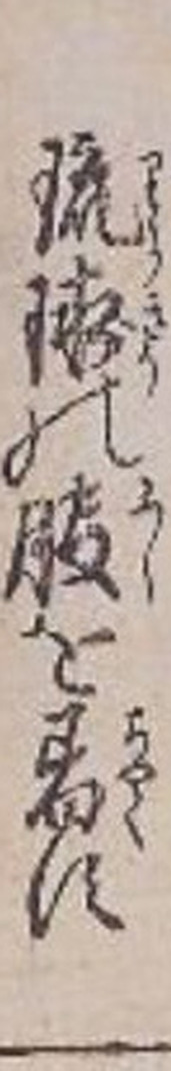琉球の服を着す
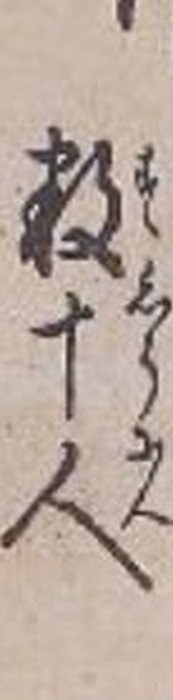数十人

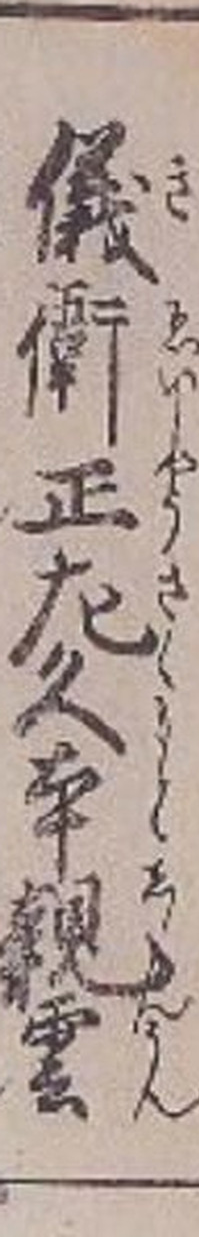議衛正左久本親雲上
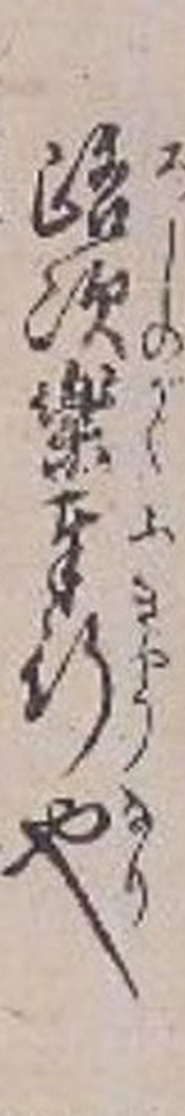路次楽奉行也
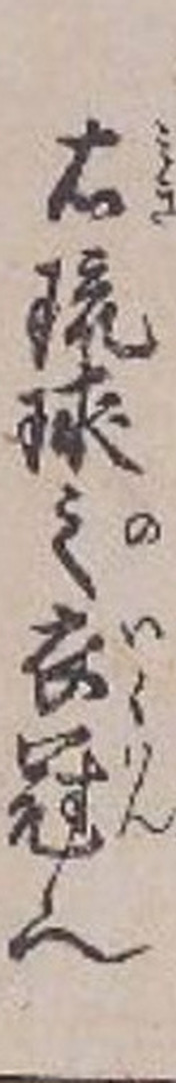右琉球之衣冠也
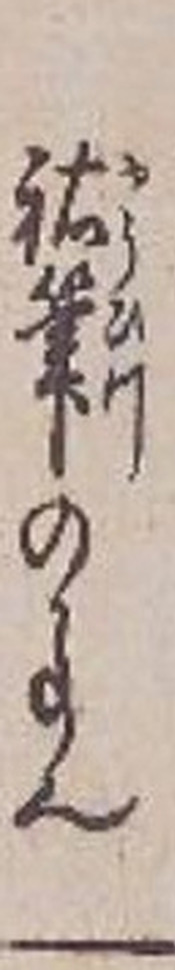祐筆の事也
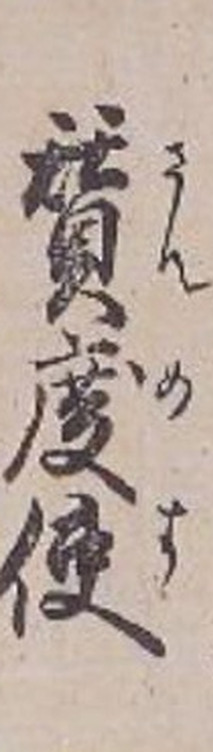賛度使
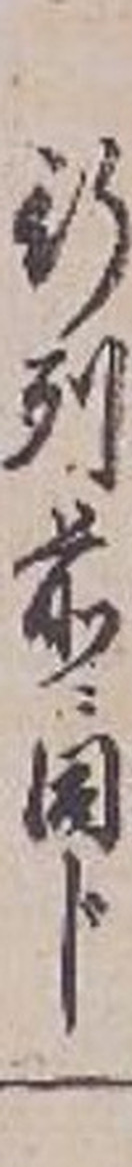行列前に同じ
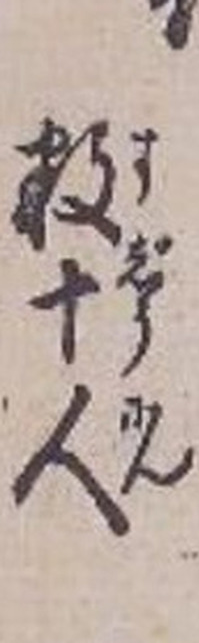数十人

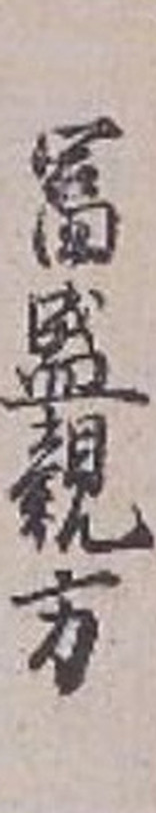冨盛親方
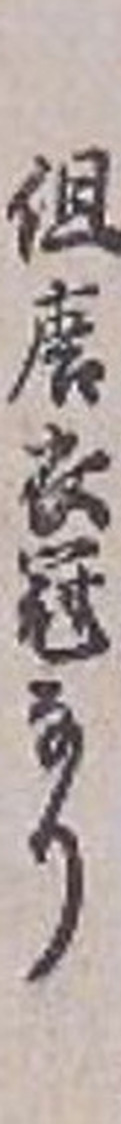但唐衣冠也
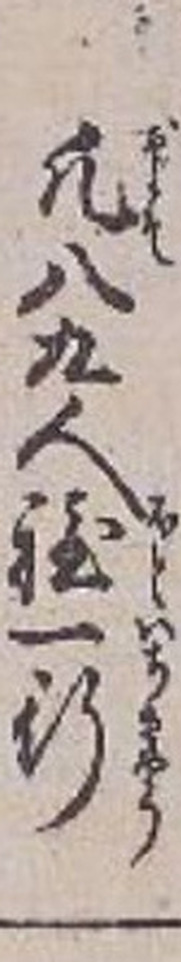凡八九人程一行
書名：琉球人大行列記 大全 来朝新板絵入
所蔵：University of the Ryukyus Library
